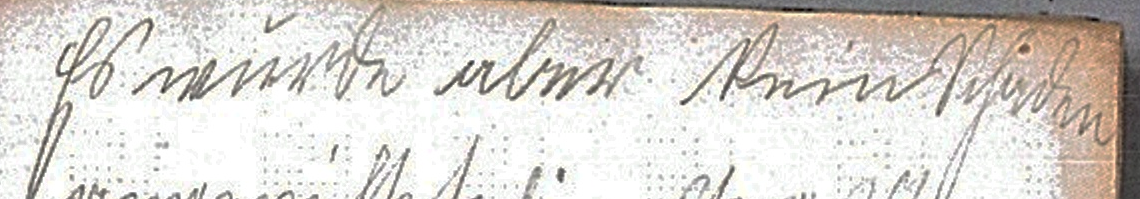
Es wurde aber kein Schaden
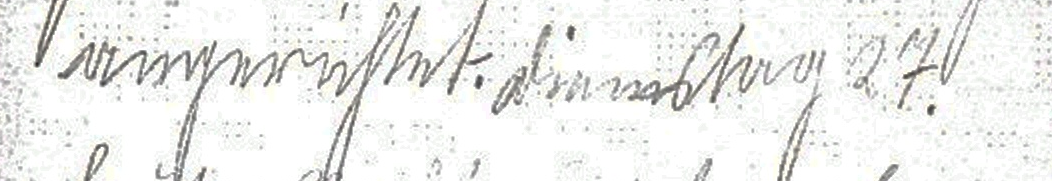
angerichtet. Dienstag 27.
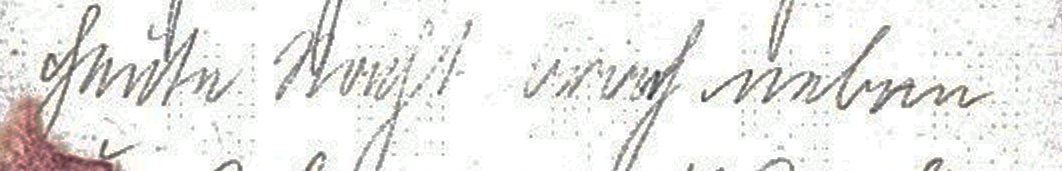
heute Nacht brach neben
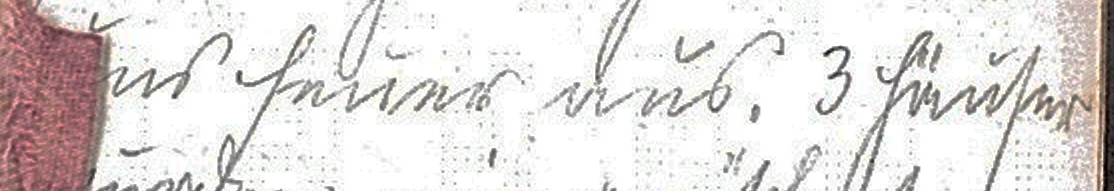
uns feuer aus. 3 Häuser
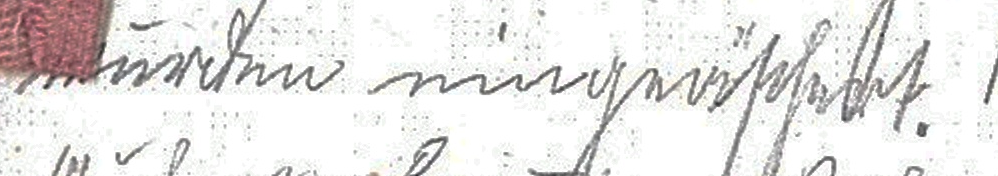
wurden eingeäschert.
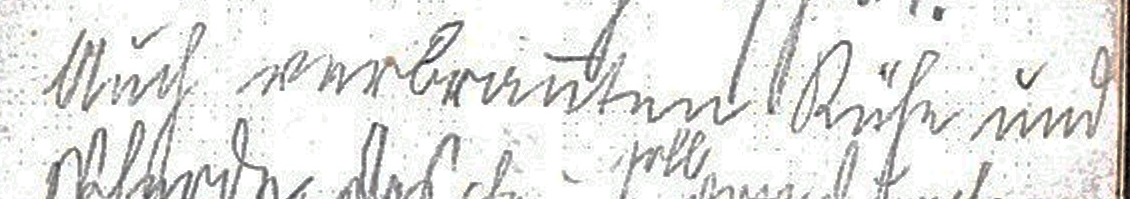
Auch verbrannten Kühe und
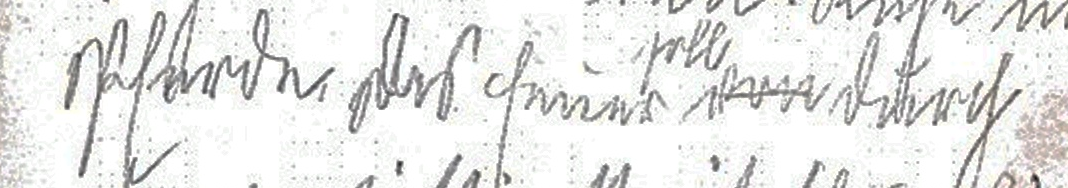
Pferde das feuer soll durch
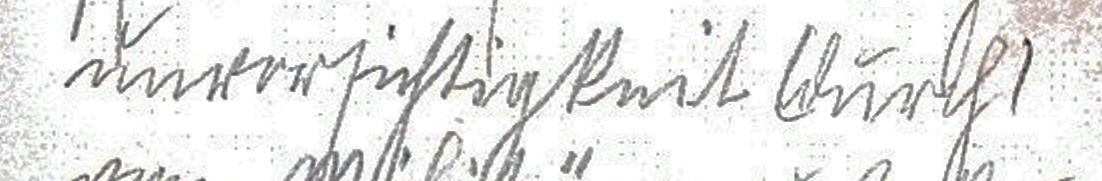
Unvorsichtigkeit (durch)
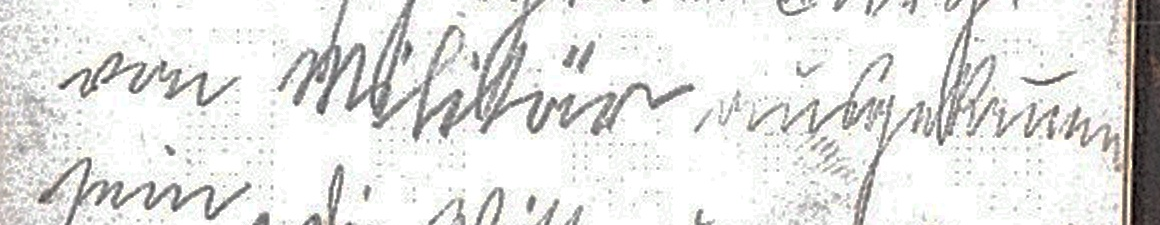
von Militär ausgebrochen
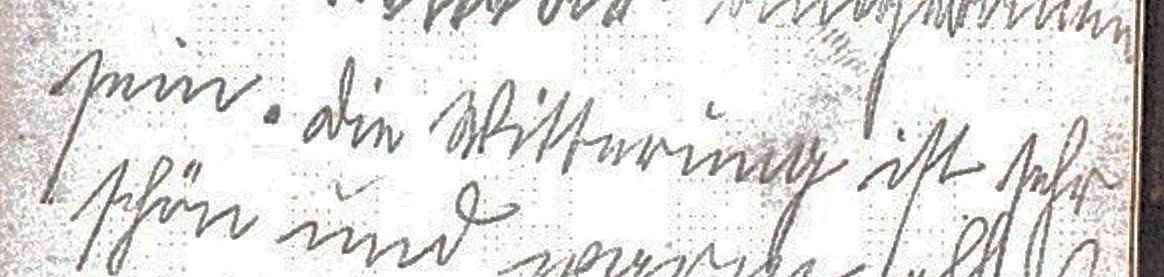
sein. Die Witterung ist sehr
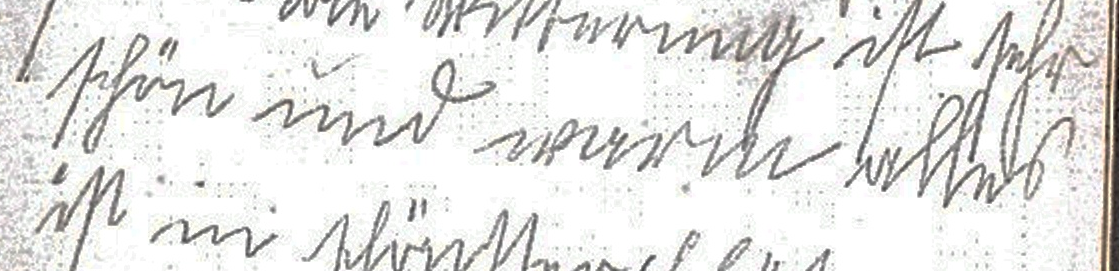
schön und warm alles
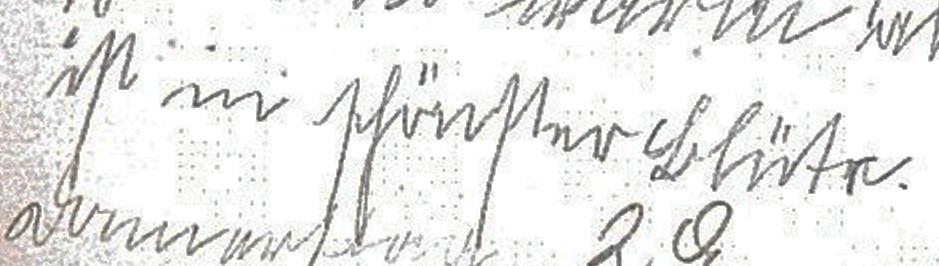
ist in schönster Blüte.
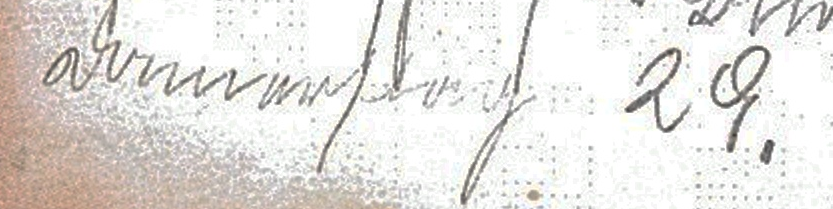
Donnerstag 29.
